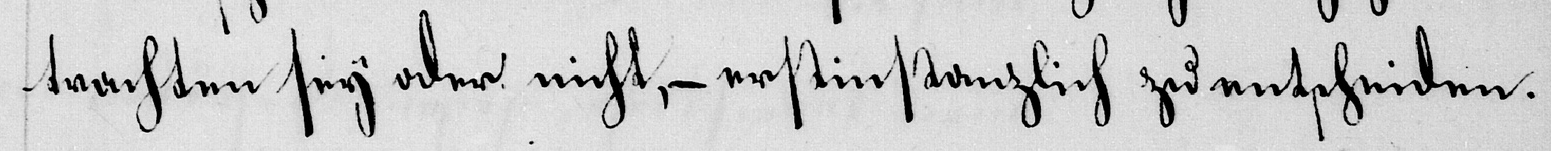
trachten sey oder nicht, – erstinstanzlich zu entscheiden.
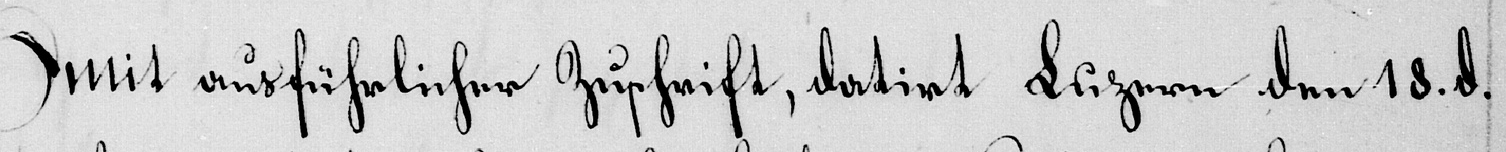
Mit ausführlicher Zuschrift, datirt Luzern den 18. d.
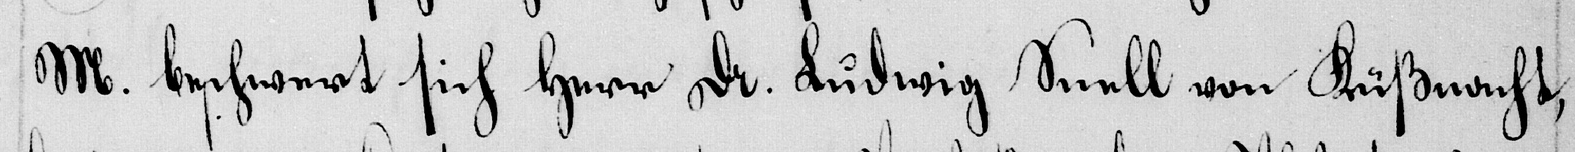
M. beschwert sich Herr Dr. Ludwig Snell von Küßnacht,
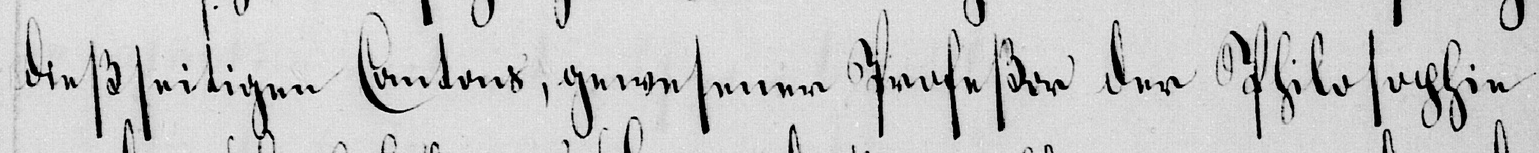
dießseitigen Cantons, gewesener Profeßor der Philosophie
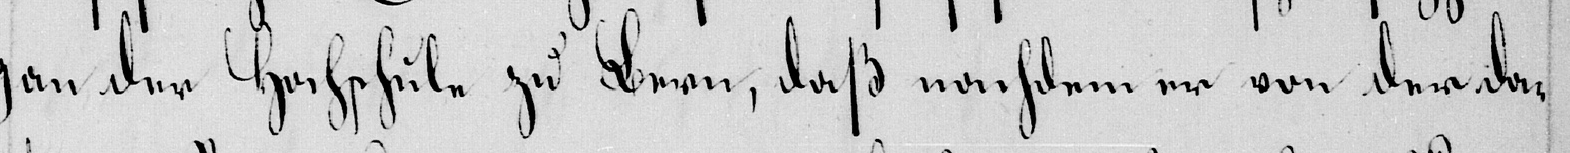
an der Hochschule zu Bern, daß nachdem er von der da¬
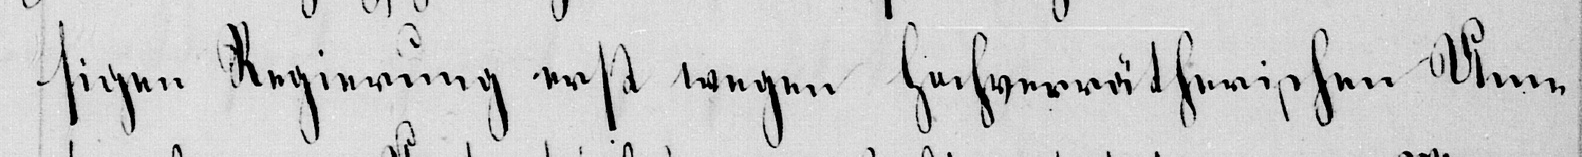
sigen Regierung erst wegen hochverräthischen Um¬
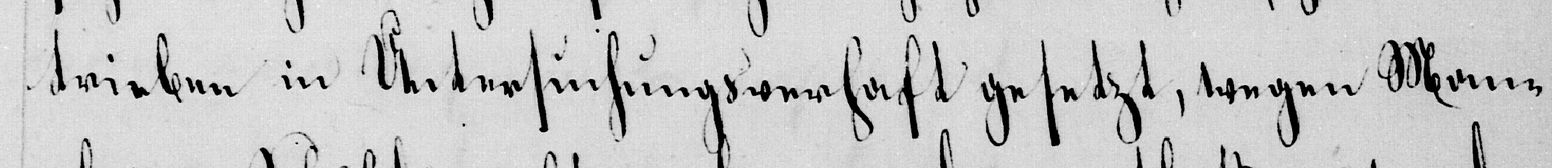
trieben in Untersuchungsverhaft gesetzt, wegen Man¬
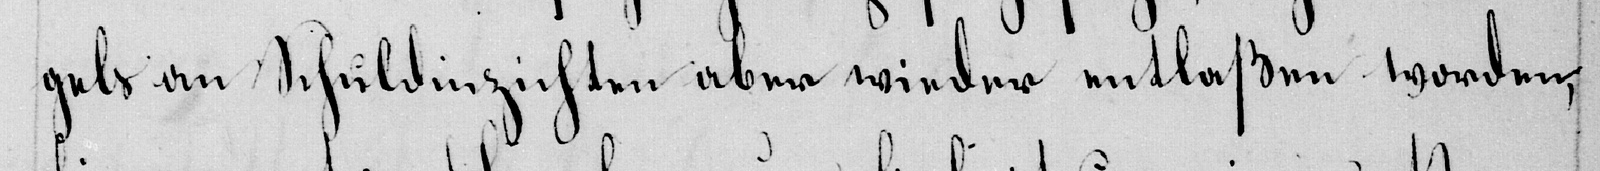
gels an Schuldinzichten aber wieder entlaßen worden,
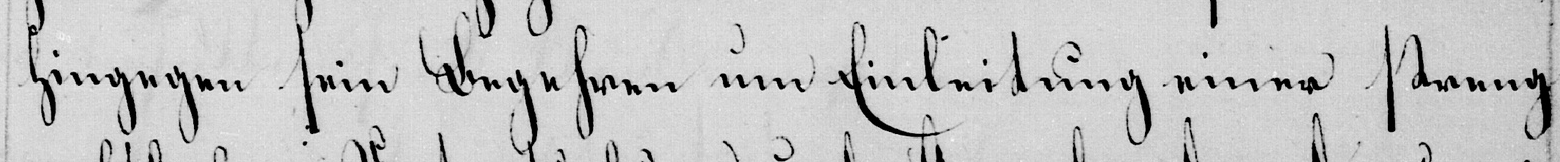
hingegen sein Begehren um Einleitung einer streng
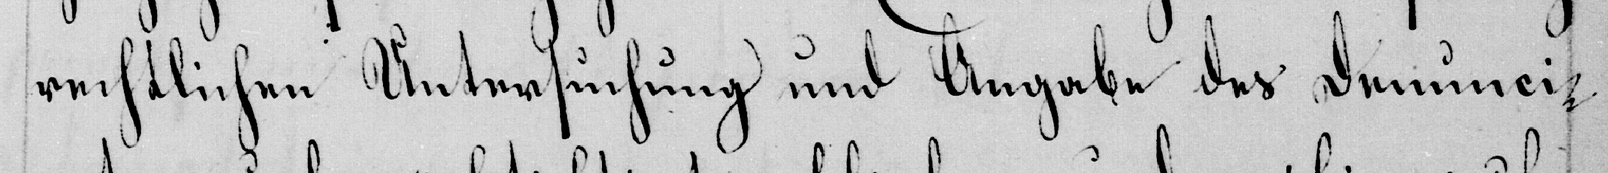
rechtlichen Untersuchung und Angabe des Denunci¬
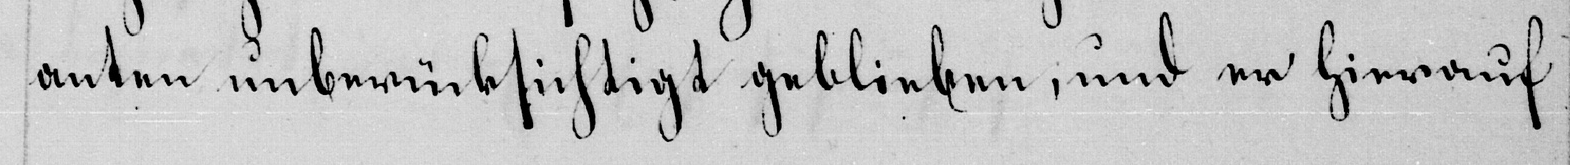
anten unberücksichtigt geblieben, und er hierauf
